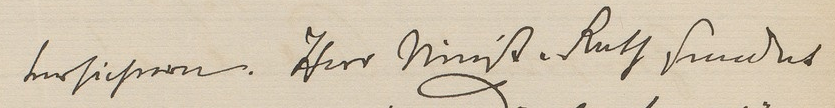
versichern. Herr Minist.Rath sendet
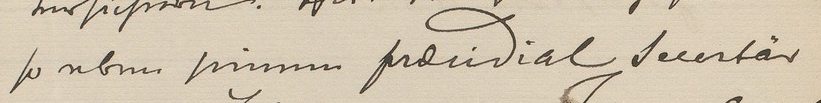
so eben seinem præsidial Secretär
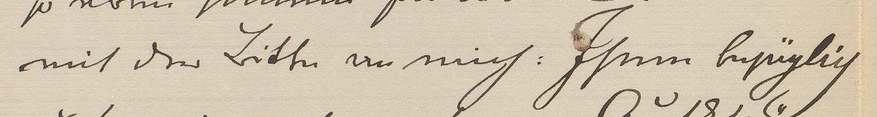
mit der Bitte an mich: Ihnen bezüglich
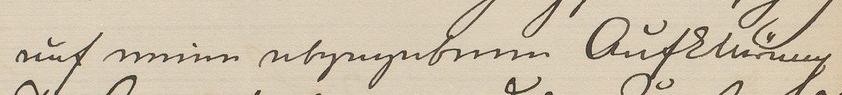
auf meine abgegebene Aufklärung
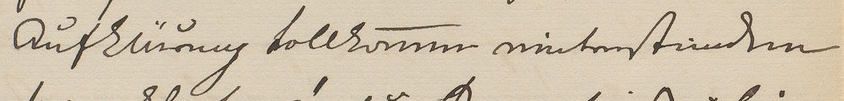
Aufklärung vollkommen einverstanden
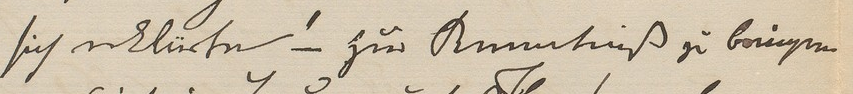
sich erklärte – zur Kenntniß zu bringen
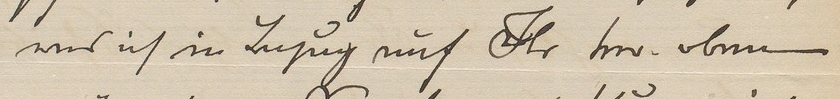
was ich in Bezug auf Ihr ver. oben
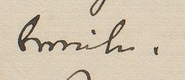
beeile.
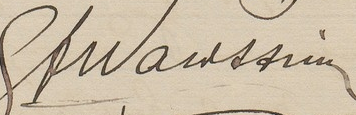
J Waldstein
